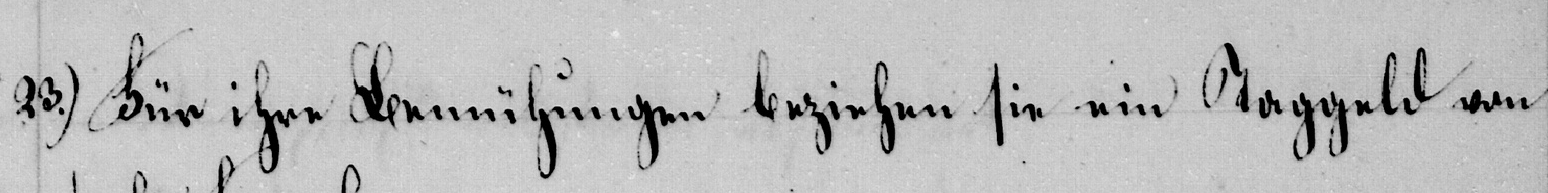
23.) Für ihre Bemühungen beziehen sie ein Taggeld von
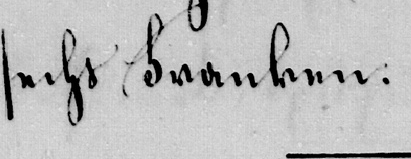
sechs Franken.
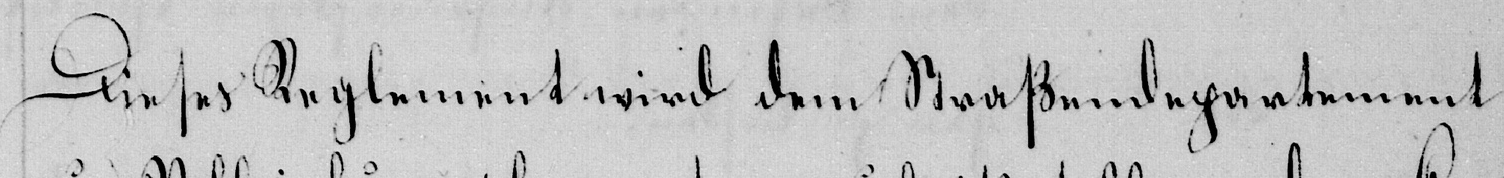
Dieses Reglement wird dem Straßendepartement
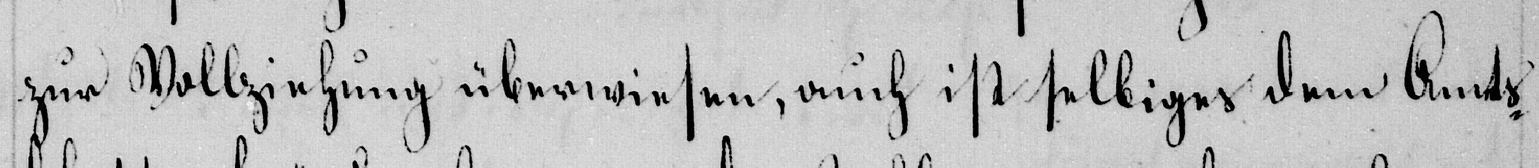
zur Vollziehung überwiesen, auch ist selbiges dem Amts¬
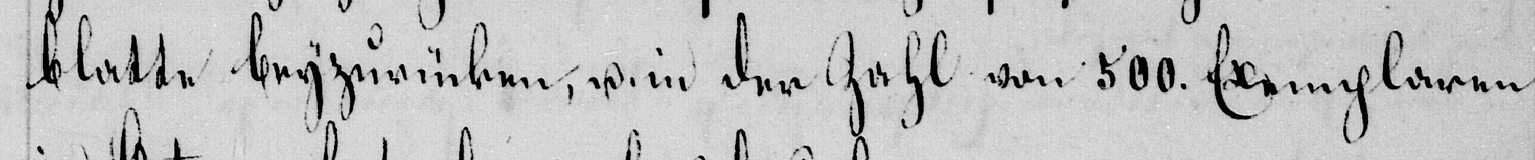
blatte beyzurücken, u. in der Zahl von 500. Exemplaren
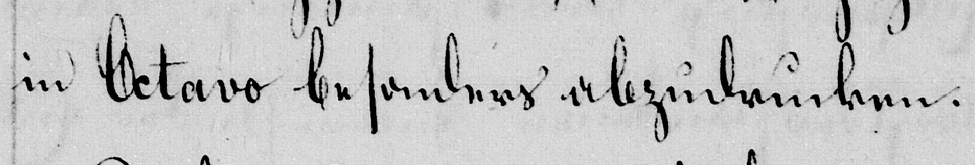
in Octavo besonders abzudrucken.
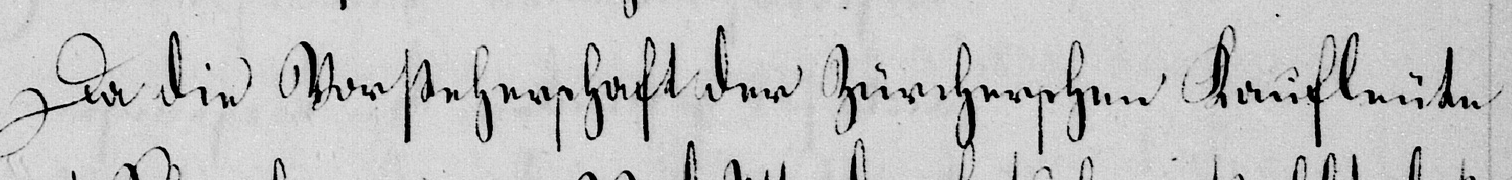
Da die Vorsteherschaft der Zürcherschen Kaufleute
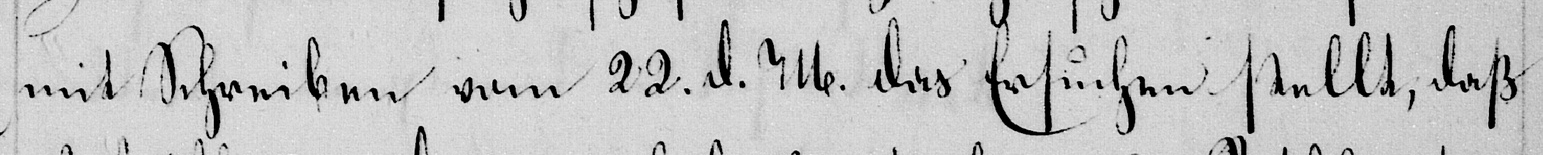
mit Schreiben vom 22. d. M. das Ersuchen stellt, daß
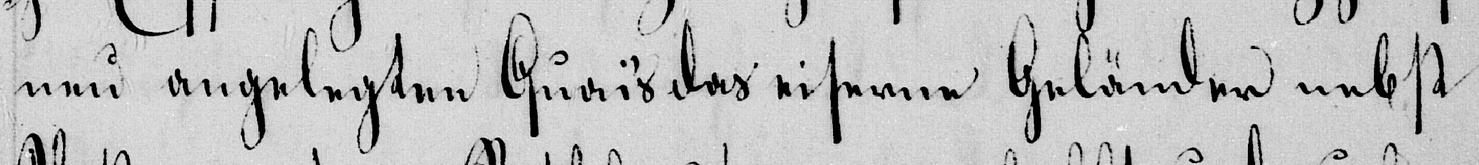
neu angelegten Quai’s das eiserne Geländer nebst
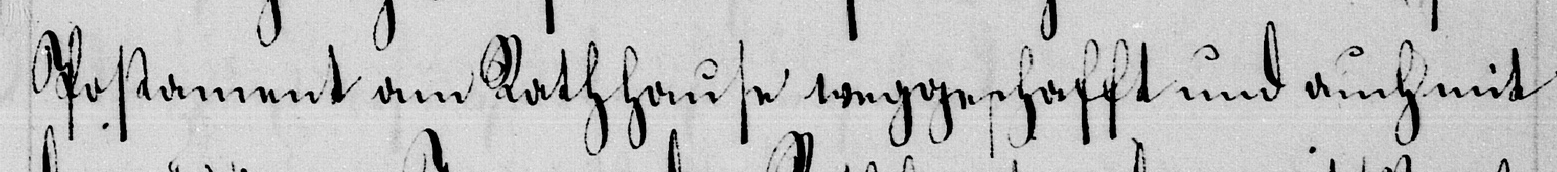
Postament am Rathhause weggeschafft und auch mit
